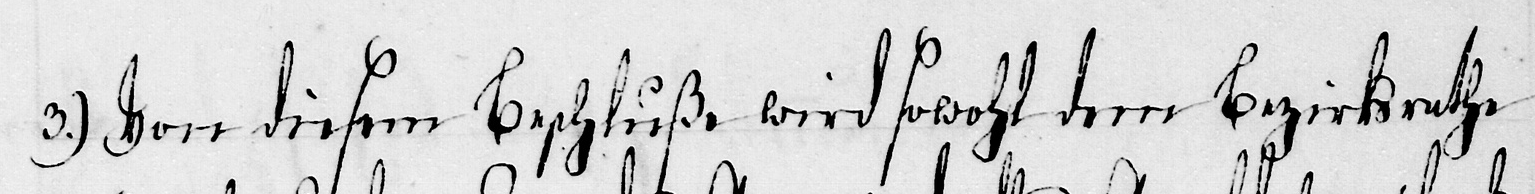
3.) Von diesem Beschluße wird sowohl dem Bezirksrathe
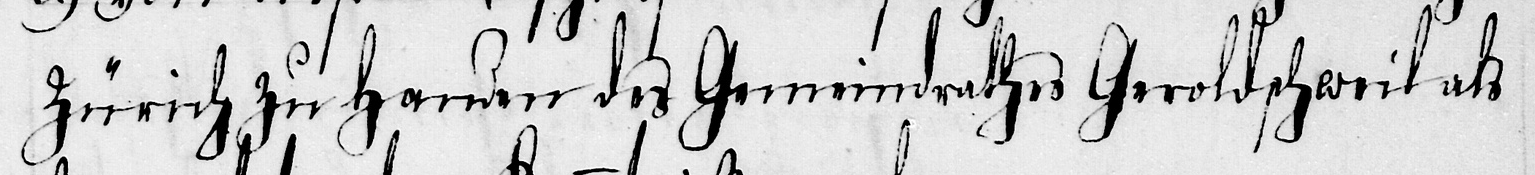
Zürich zu Handen des Gemeindrathes Geroldschweil als
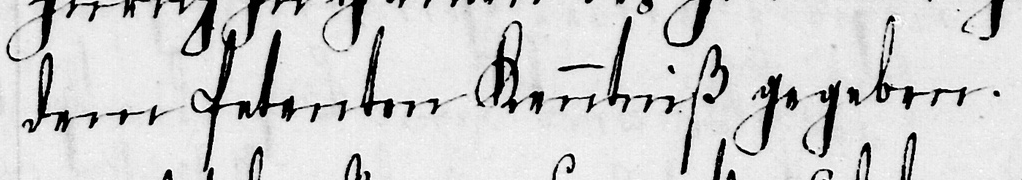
dem Petenten Kenntniß gegeben.
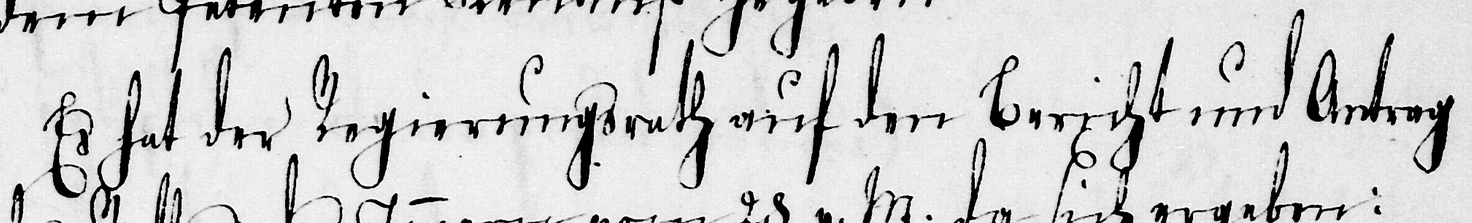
Es hat der Regierungsrath auf den Bericht und Antrag
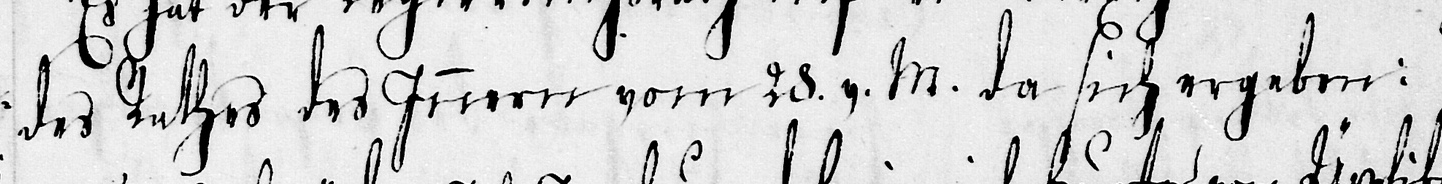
des Rathes des Innern vom 28. v. M. da sich ergeben:
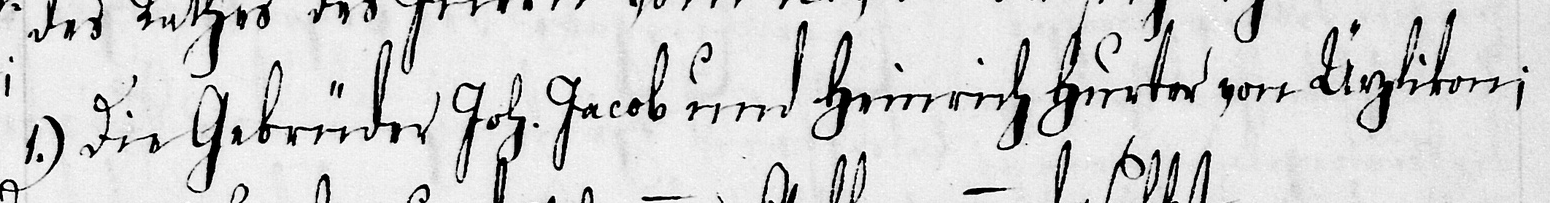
1.) Die Gebrüder Joh. Jacob und Heinrich Hurter von Ürzlikon;
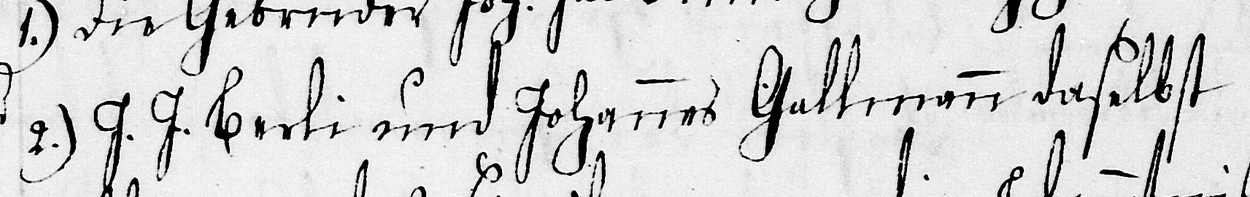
2.) J. J. Berli und Johannes Gallmann daselbst
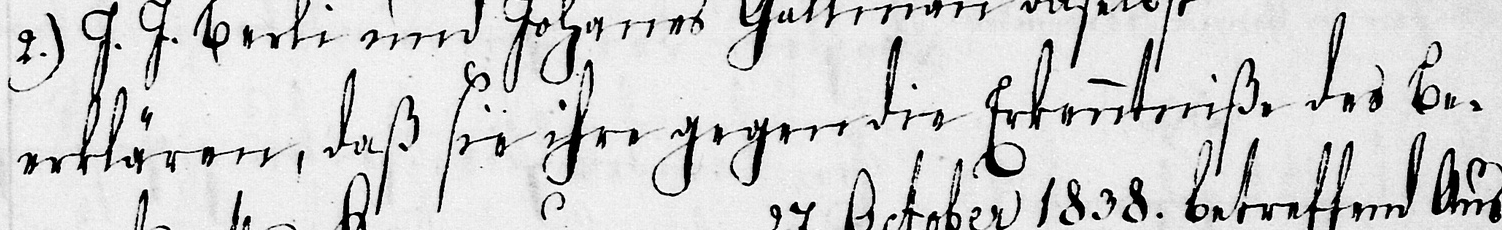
erklären, daß sie ihre gegen die Erkenntniße des Be¬
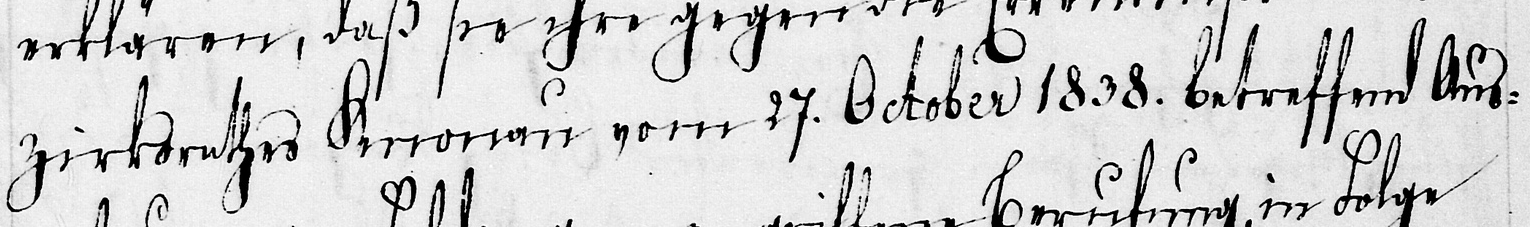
zirksrathes Knonau vom 27. October 1838. betreffend Aus¬
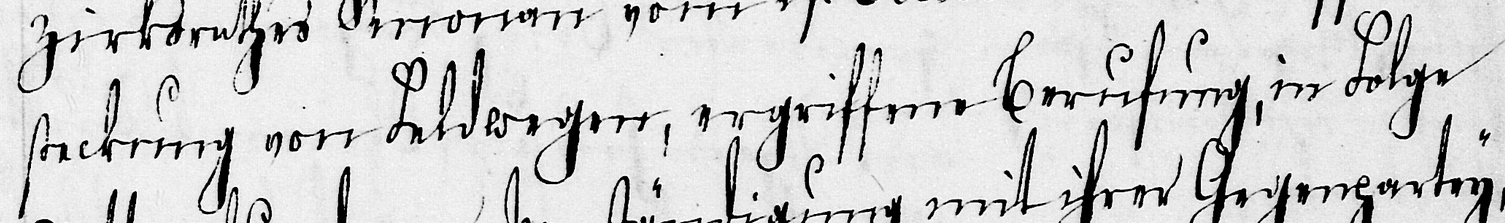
steckung von Feldwegen, ergriffene Berufung, in Folge
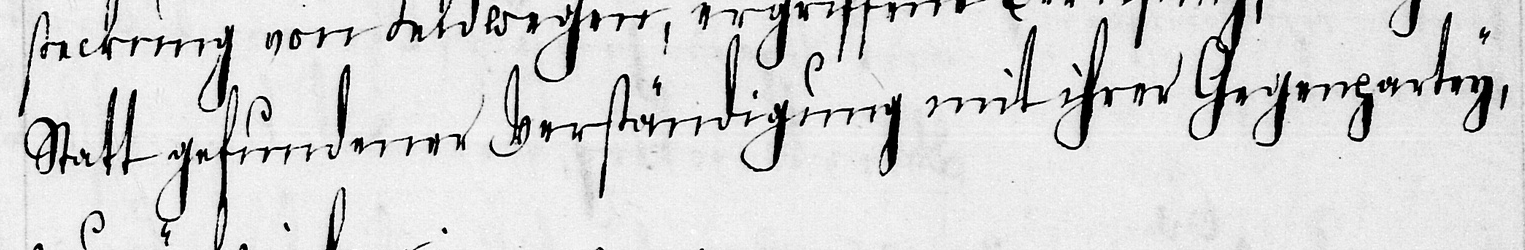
Statt gefundener Verständigung mit ihrer Gegenpartey,
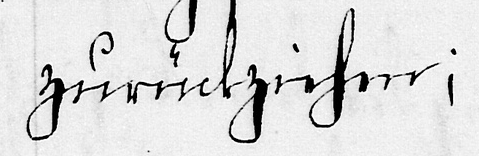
zurückziehen;
